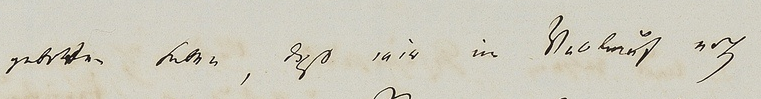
geboten haben, daß wir im Verlauf noch
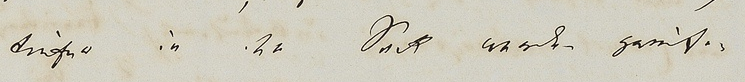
tiefer in den Sack werden greifen
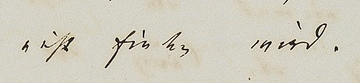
nicht finden wird.
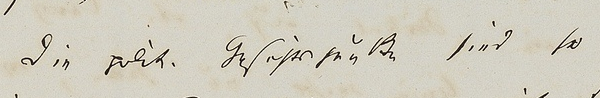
Die polit. Gesichtspunkte sind so
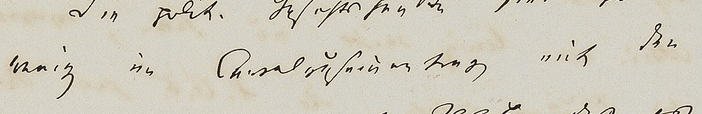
wenig im Causalzusammenhang mit den
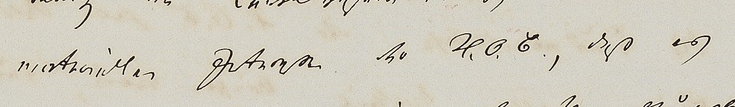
materiellen Intereßen der N.O.B., daß es
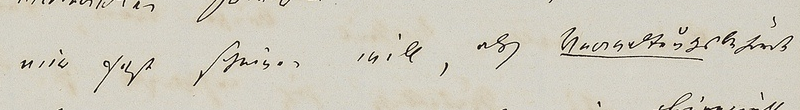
mir fast scheinen will, als Verwaltungsbehörde
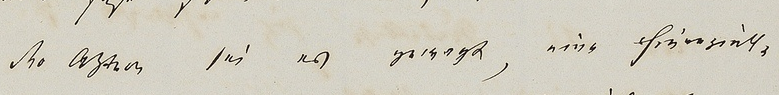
der letztern sei es gewagt, eine finanzielle
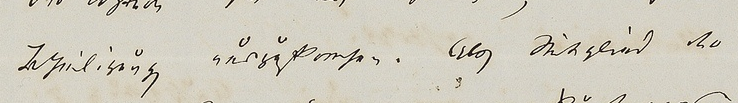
Betheiligung auszusprechen. Als Mitglied der
